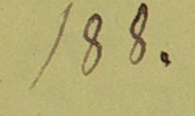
188
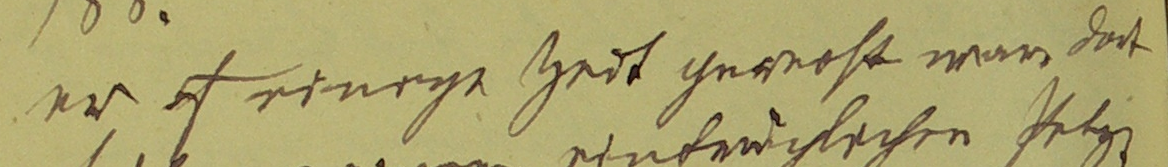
er ist einige Zeit gereist war, dort
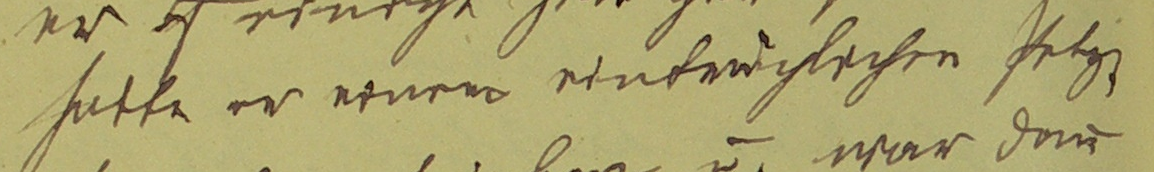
hatte er einen einträglichen Pelz¬
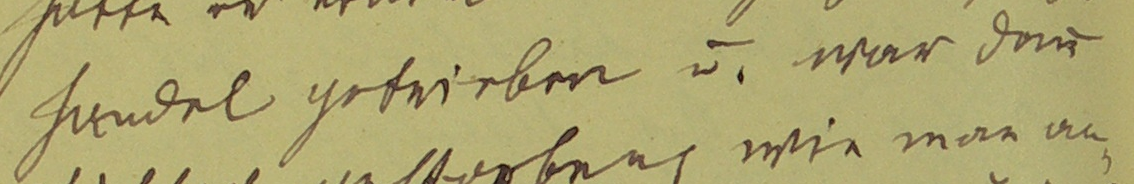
handel getrieben und war dann
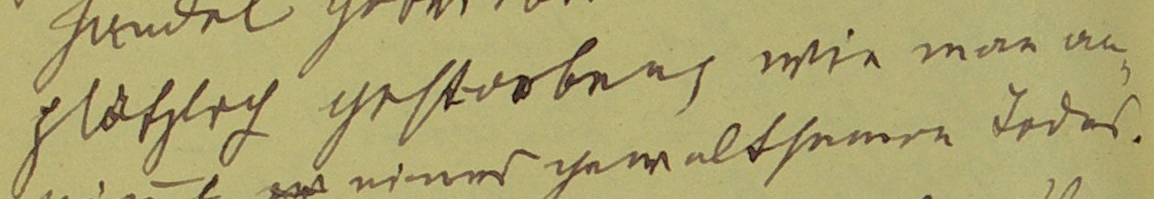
plötzlich gestorben wie man an¬
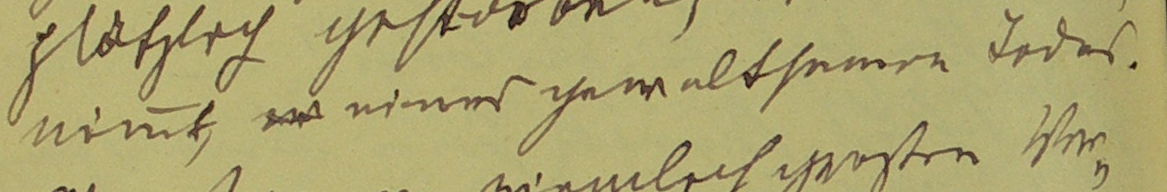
nimmt, eines gewaltsamen Todes.
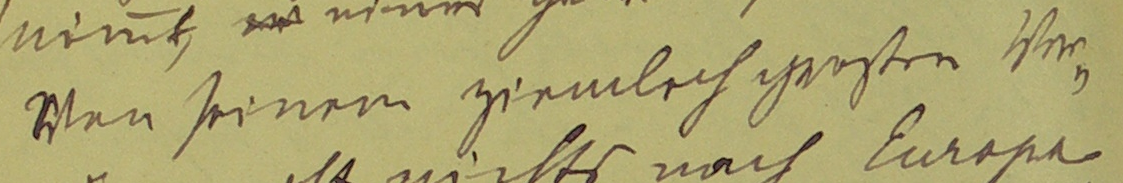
Von seinem ziemlich großen Ver¬
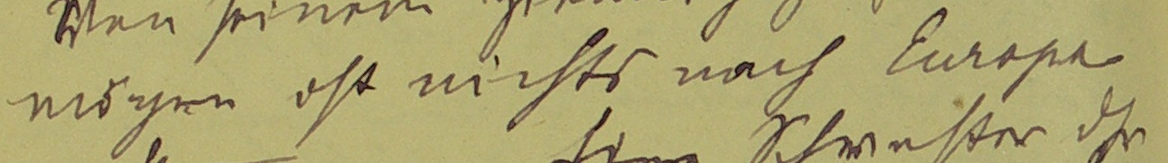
mögen ist nichts nach Europa
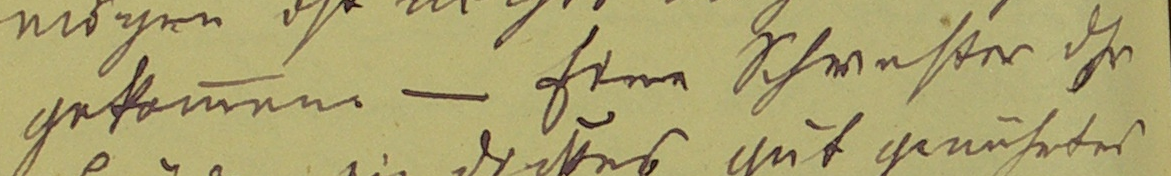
gekommen.- Eine Schwester dieser
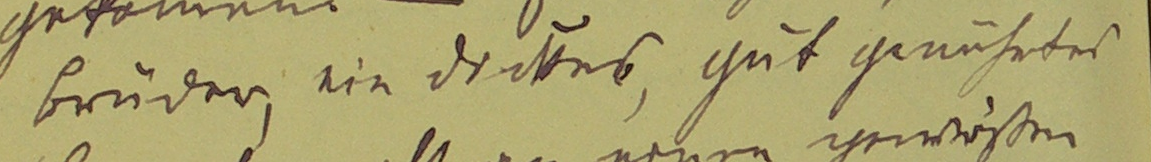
Brüder, ein dickes gut genährtes
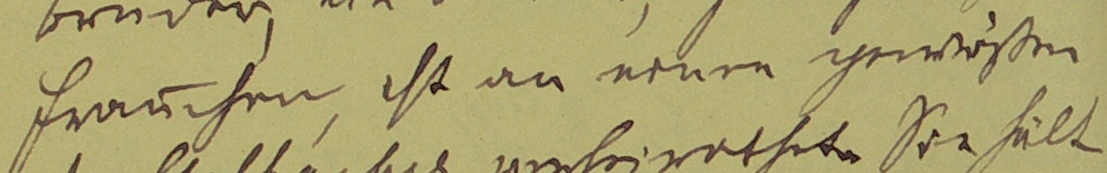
Frauchen, ist an einen gewißen
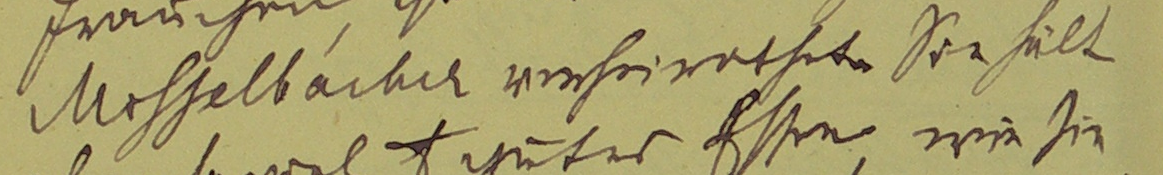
Mosselbacher verheirathet . Sie hält
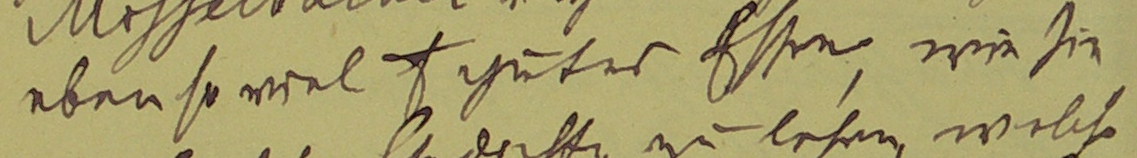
ebenso viel von gutem Essen, wie sie
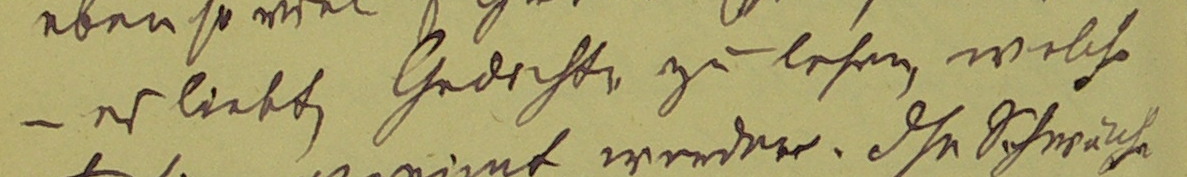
es liebt, Gedichte zu lesen, welche
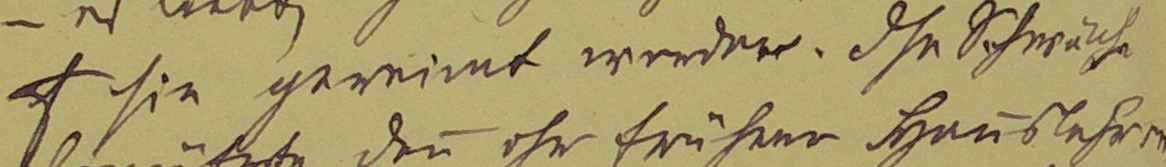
auf sie gereimt werden. Diese Schwäche
